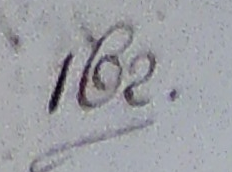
162.
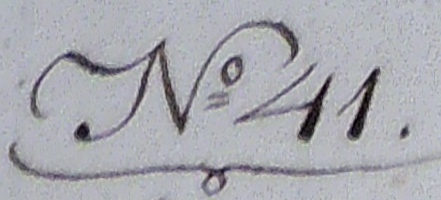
No͇ 41.
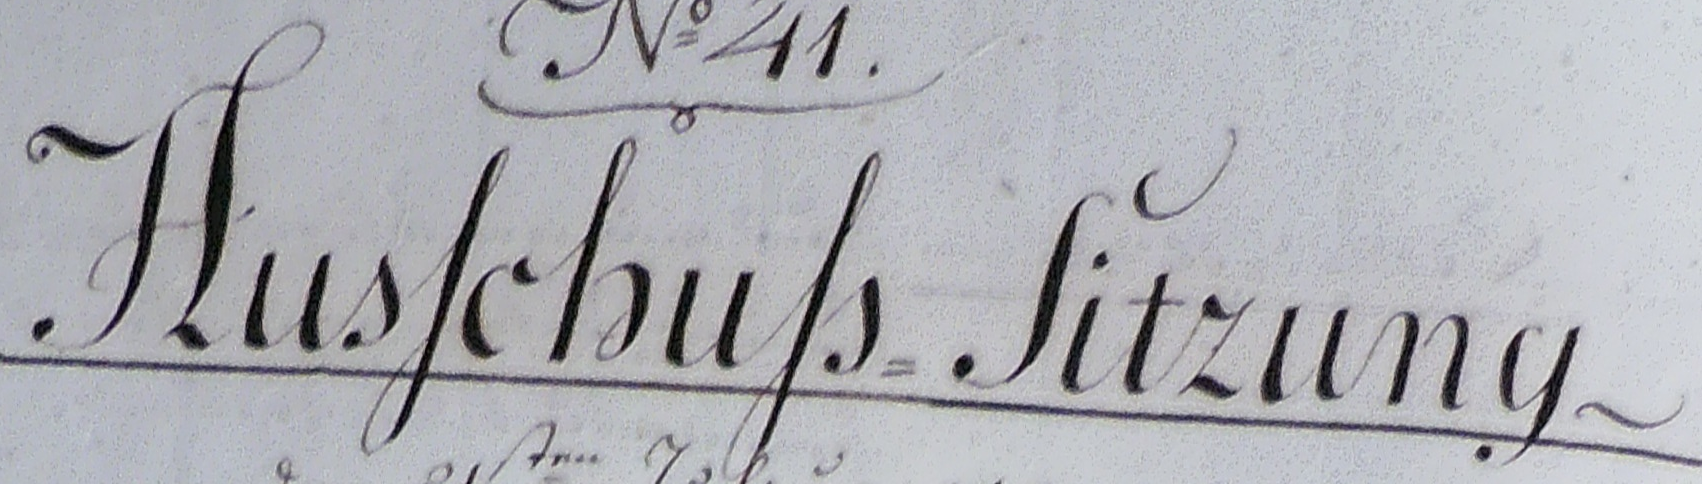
Ausschuss‗Sitzung
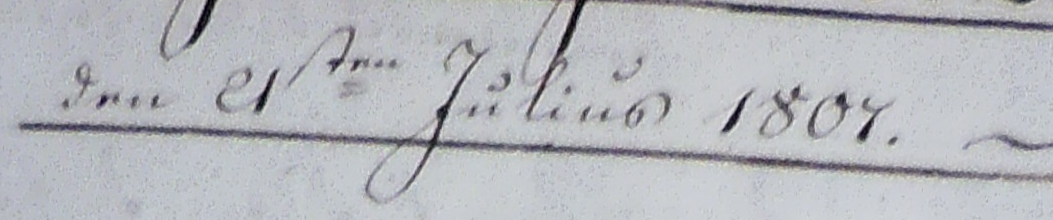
den 21te͇n Julius 1807.
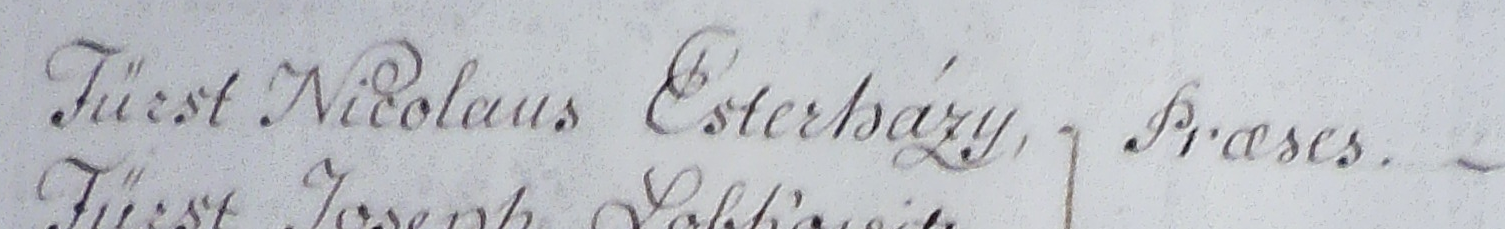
Fürst Nicolaus Esterházy, Præses.
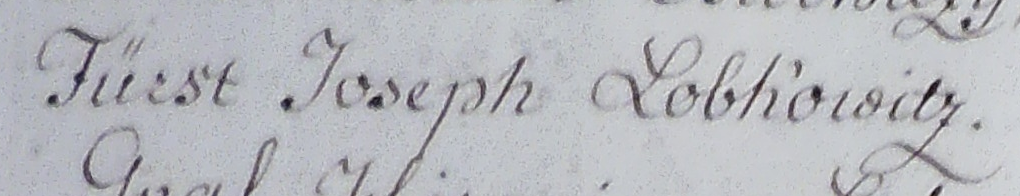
Fürst Joseph Lobkowitz.
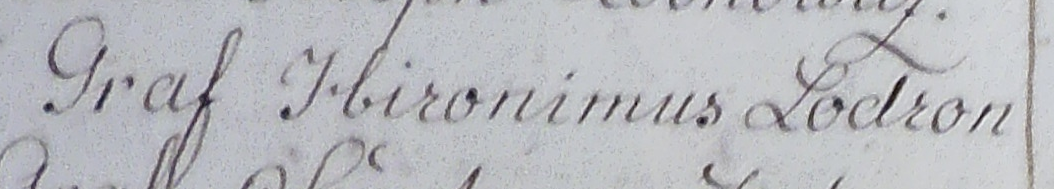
Graf Hironimus Lodron
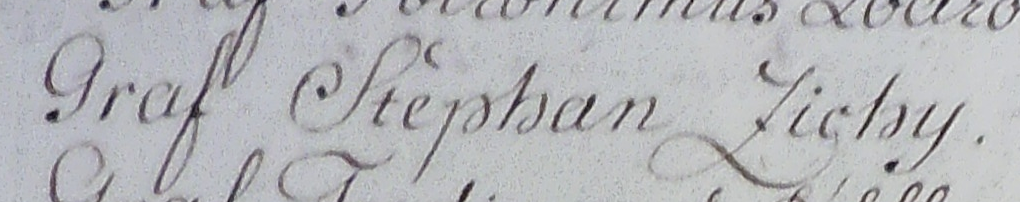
Graf Stephan Zichy.
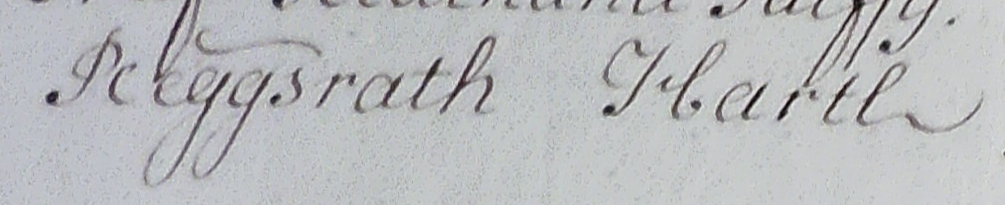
Reg͞gsrath Hartl
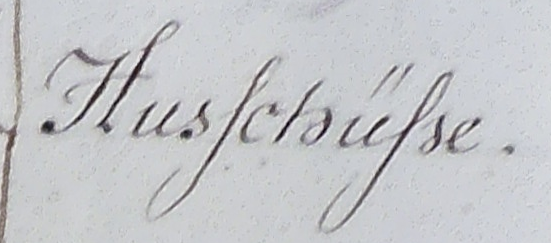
Ausschüsse.
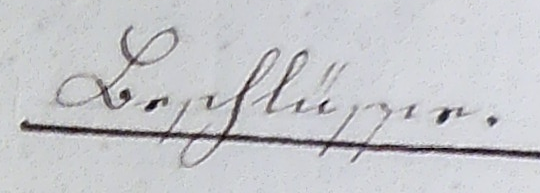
Beschlüsse.
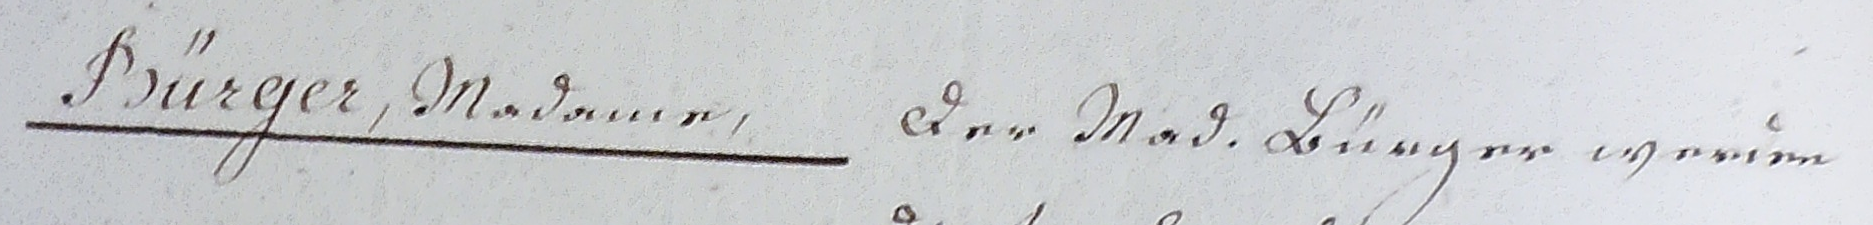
Bürger, Madame, Der Mad. Bürger werden
